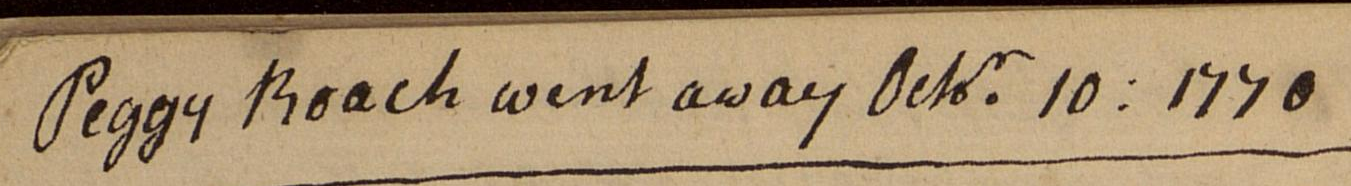Peggy Roach went away Octo^r. 10: 1770
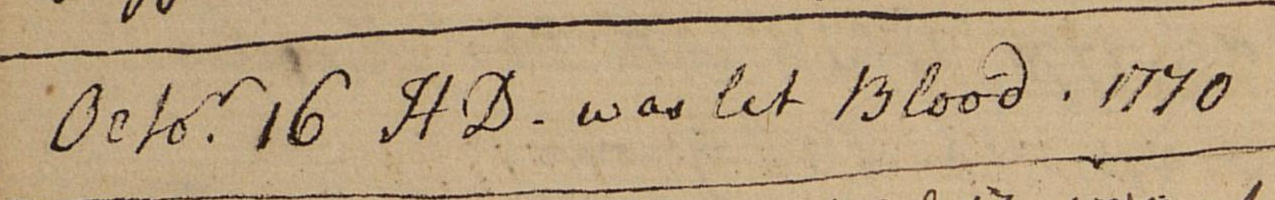Octo^r. 16 HD. was let Blood. 1770
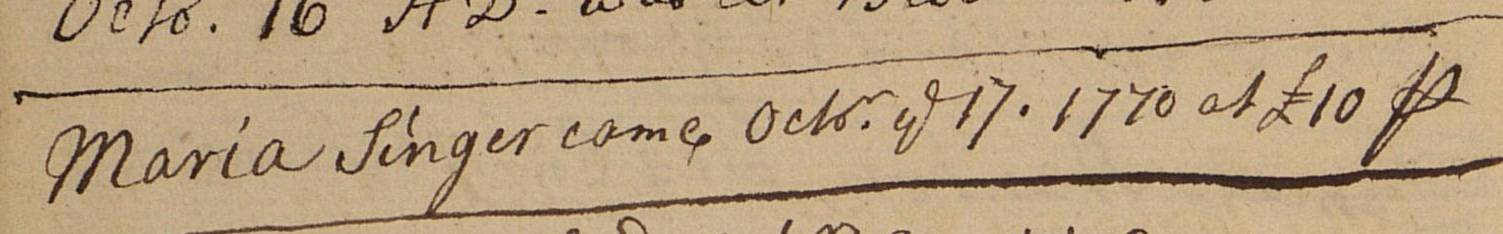Maria Singer came Octo^r. y^e 17. 1770 at 10 sterlings per
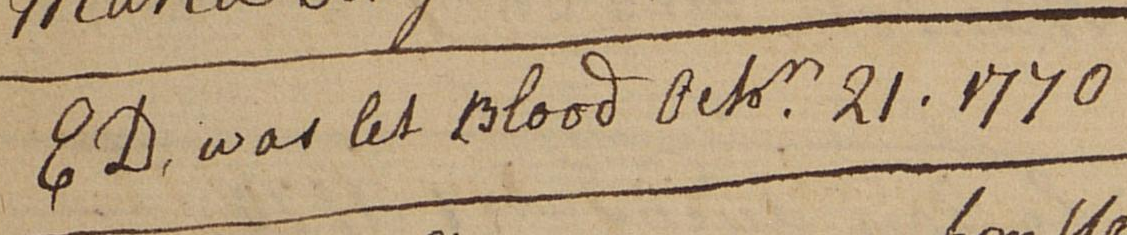ED. was let Blood Octo^r. 21.1770
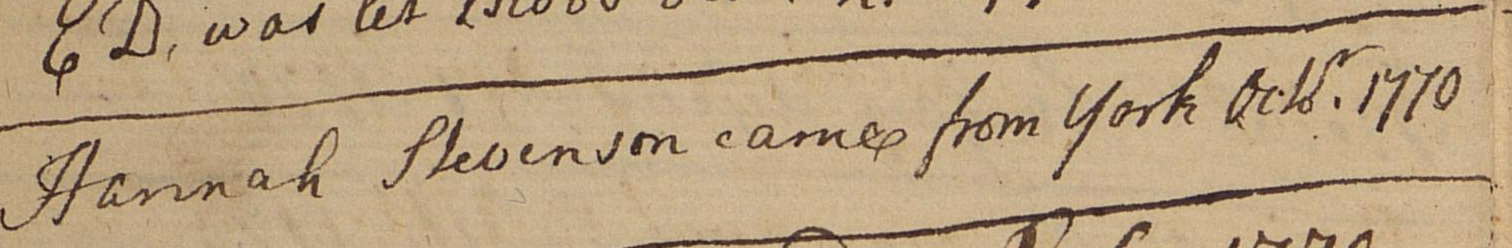Hannah Stevenson came from York Octo^r. 1770
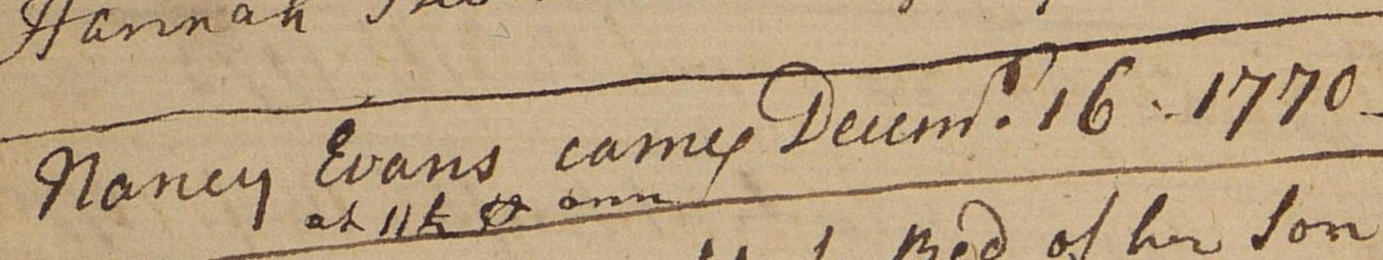Nancy Evans came Decem^r. 16.1770 -
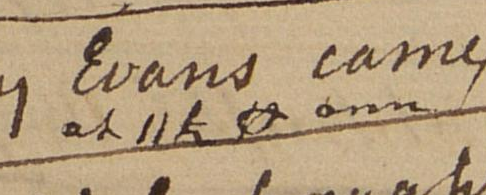at 11 sterlings per ann
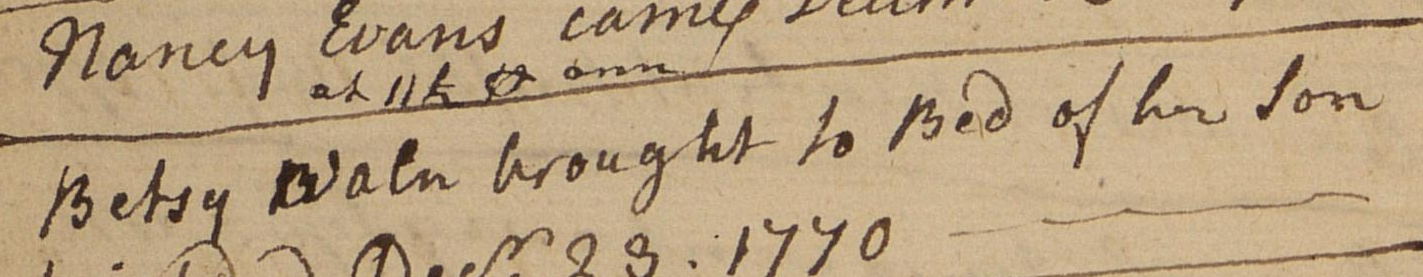Betsy Waln brought to Bed of her Son
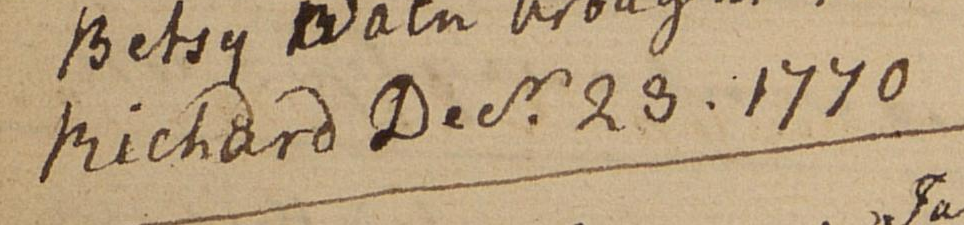Richard Dec^r. 23.1770
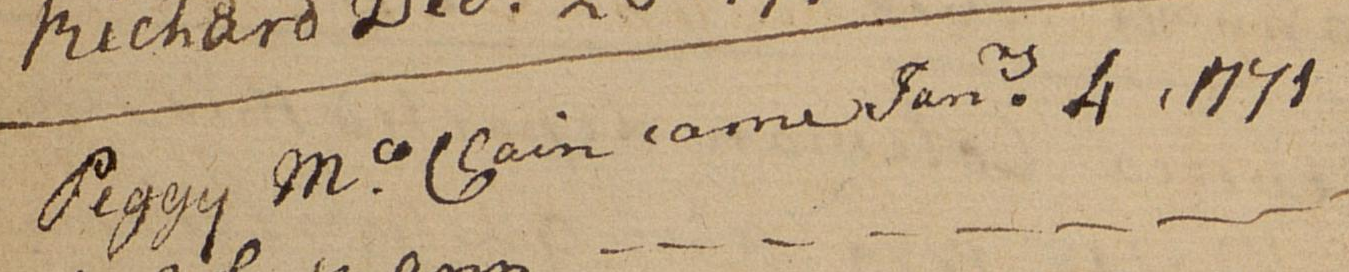Peggy M^c Clain came Jan^y. 4, 1771
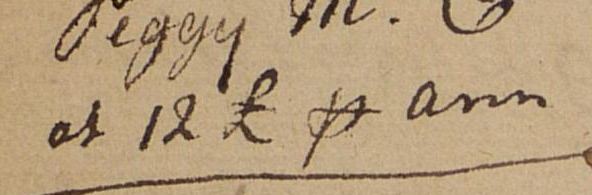at 12 sterlings per ann
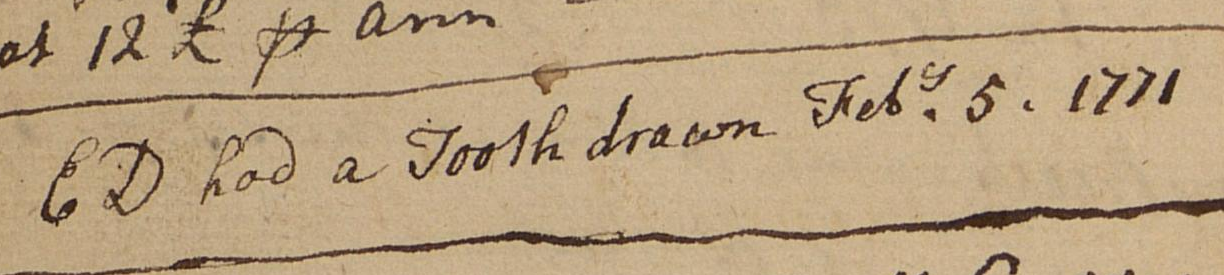ED had a Tooth drawn Feb^y. 5. 1771
